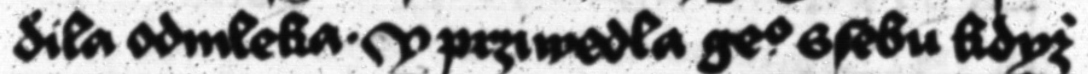dila odmléka. Y prziwedla ge° sſebú kdyż
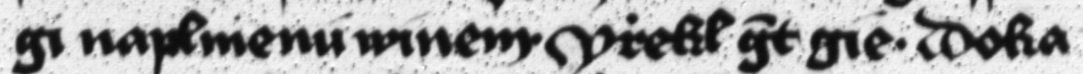gi naplnienú wínem Yṙekl ḡt gíe. Doka
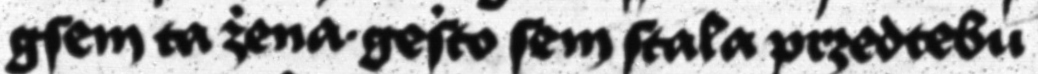gſem ta żena. geẛto ſem ſtála przedtebú
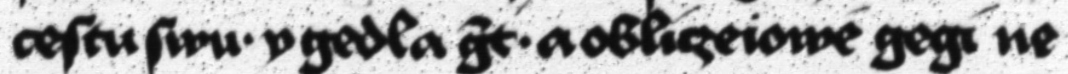ceſtu ſwú. y gedla ḡt. a oblíczeiowé gegí ne
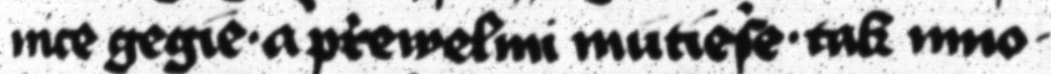nice gegíe. a pṙewelmi mútieẛe. tak mno
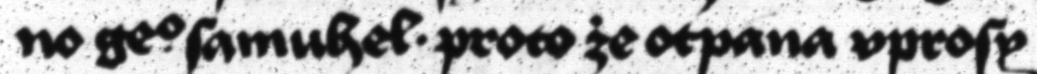no ge° ſamuhel. proto że otpána vproſy
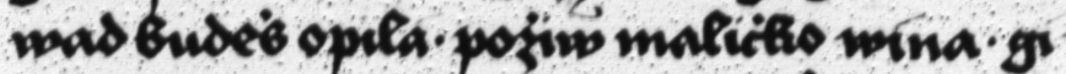wad budeṡ opilá. pożiw maliċko wína. gi
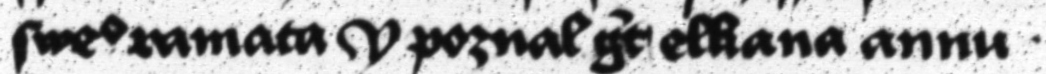ſwe° ramata Y poznal ḡt elkana annu
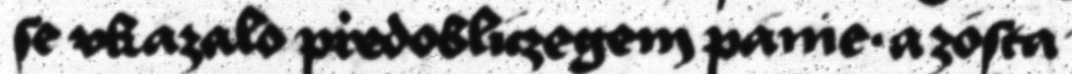ſe vkázalo pṙedoblíczegem pánie. a zóſta
